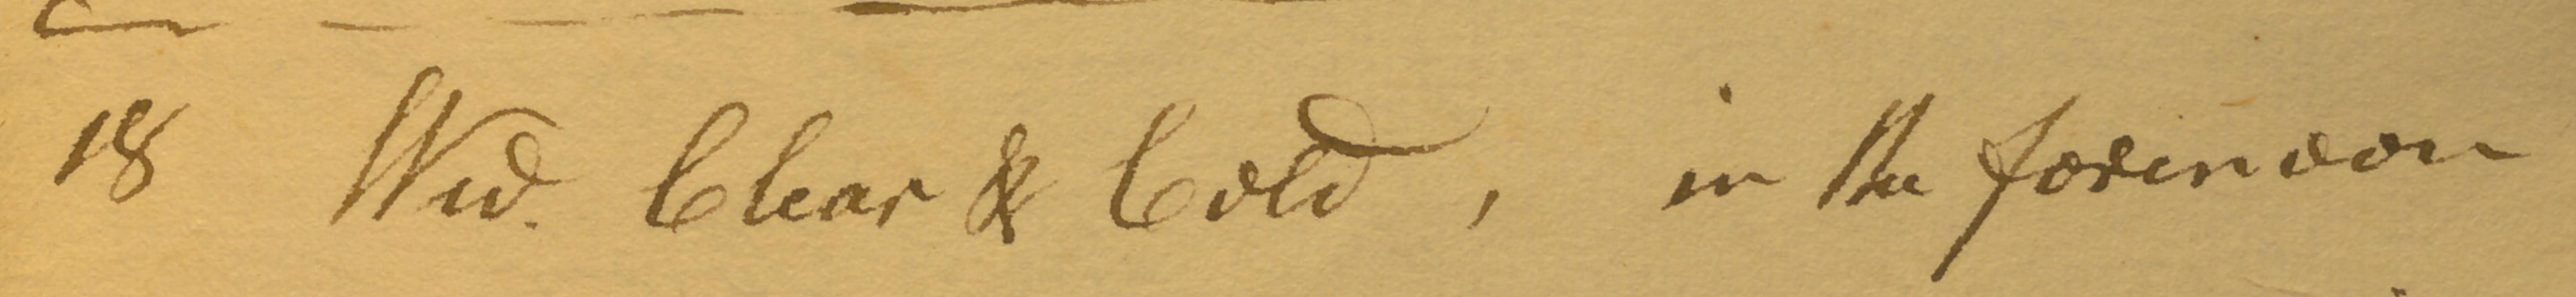18 Wed. Clear & Cold, in the forenoon
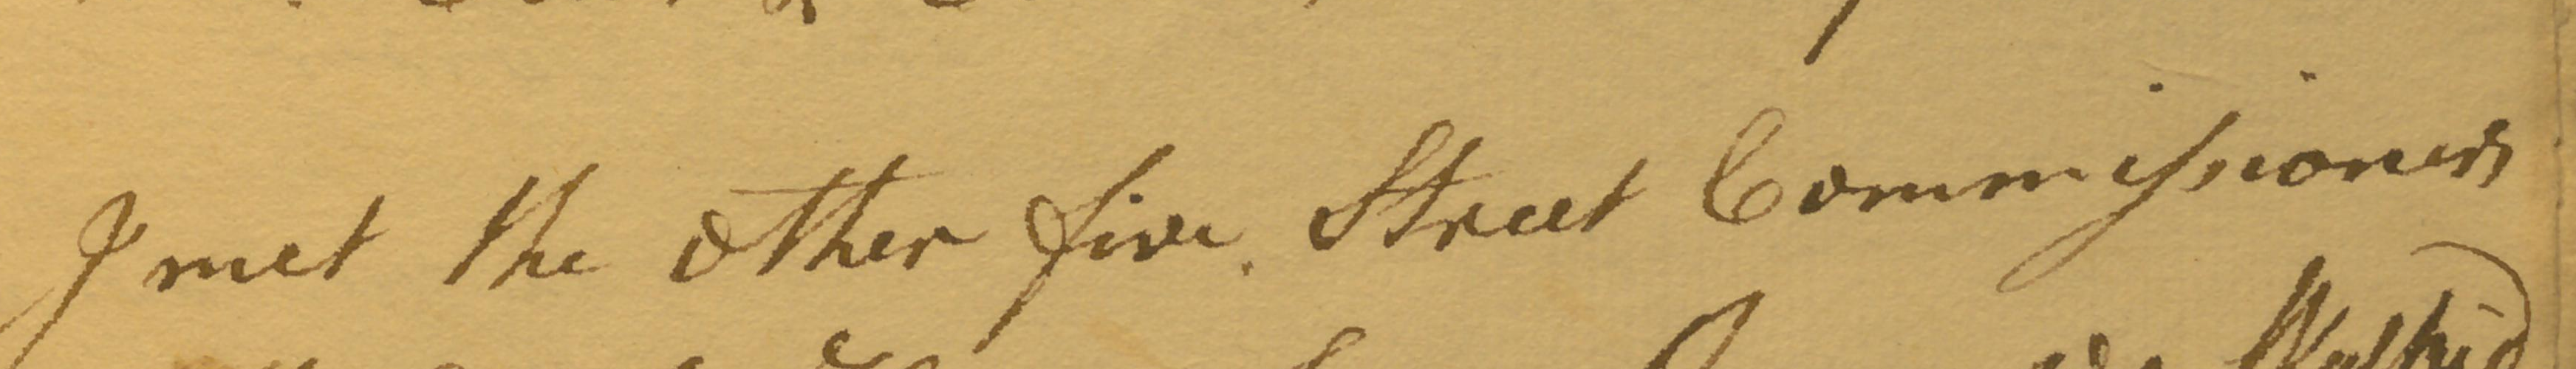I met the other fire Street Commissioners
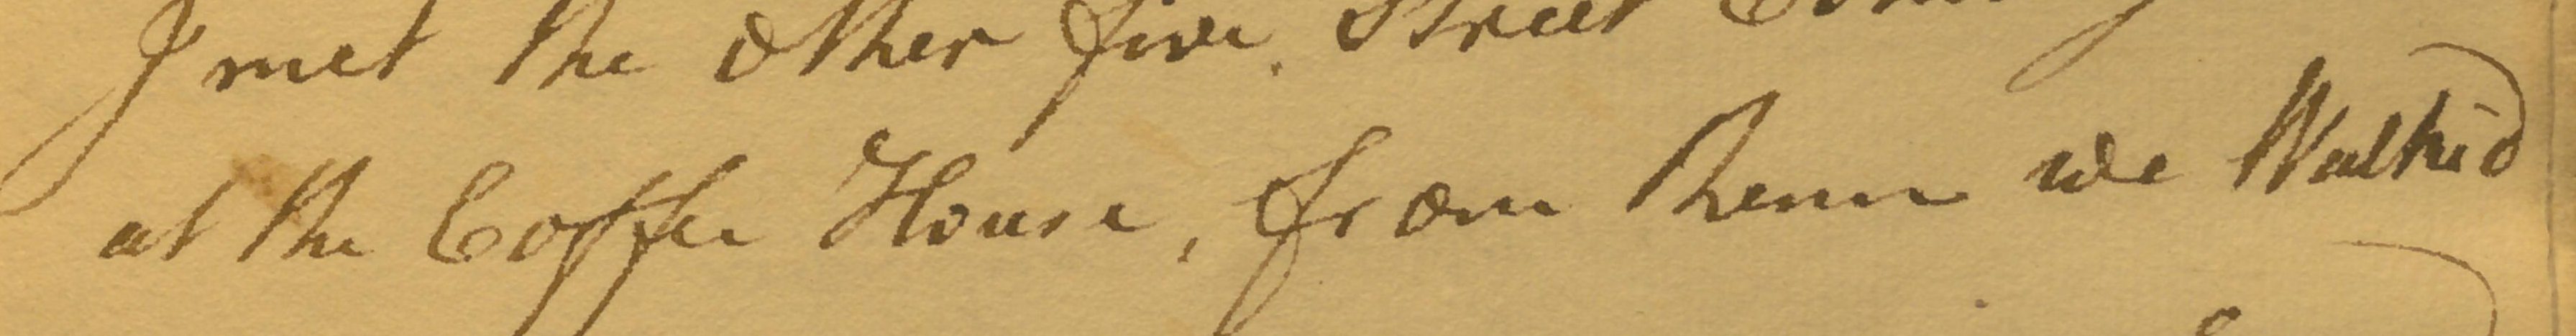at the Coffee House, from thence we Walked
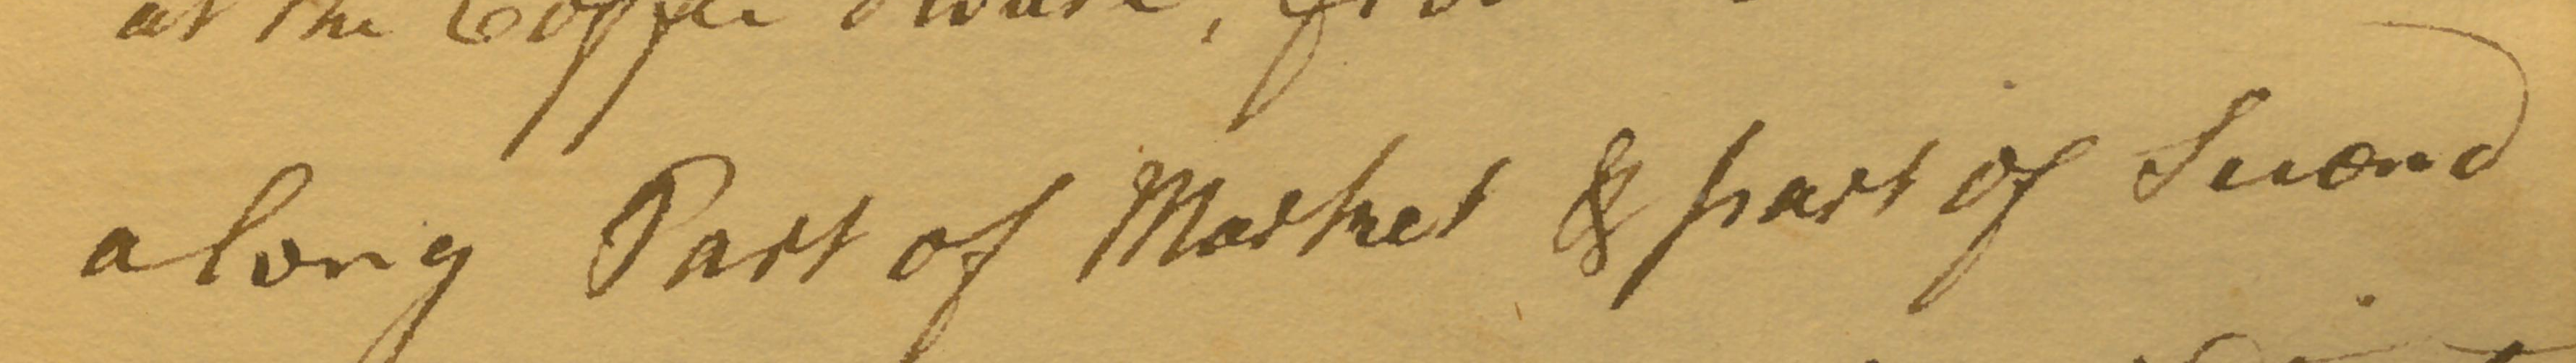along Part of Market & part of second
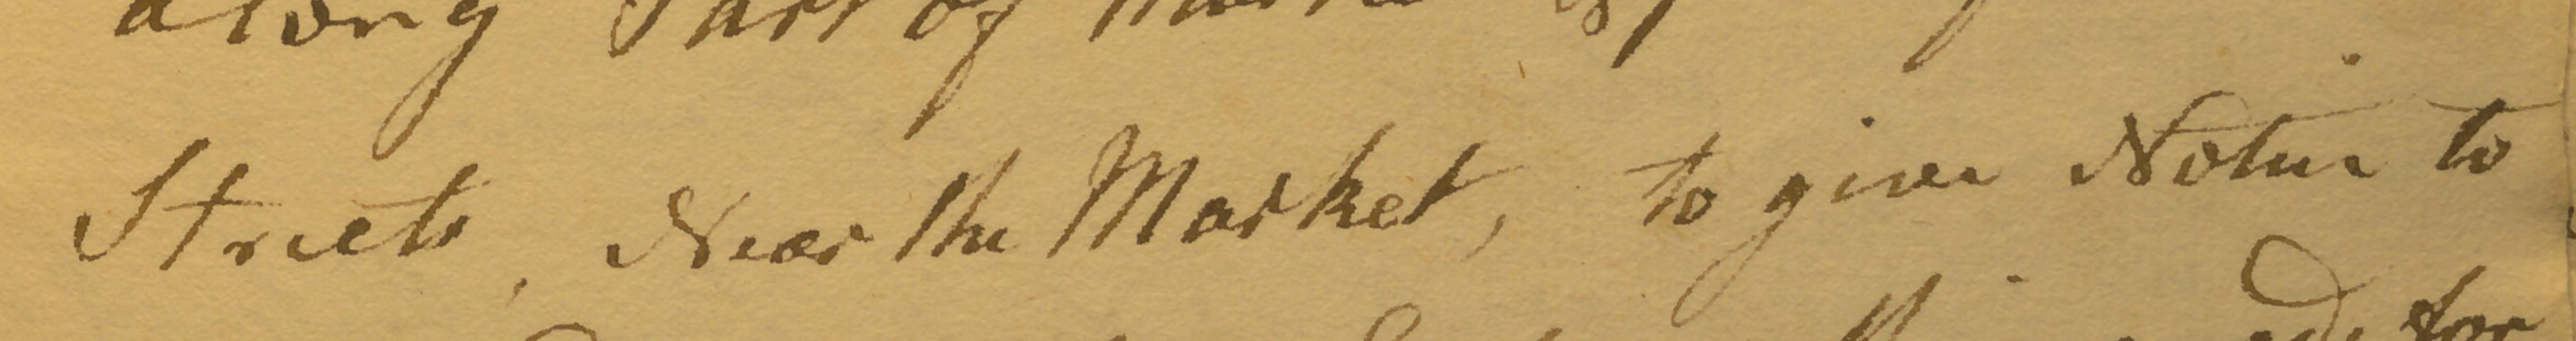Streets Near the Market, to give Notice to
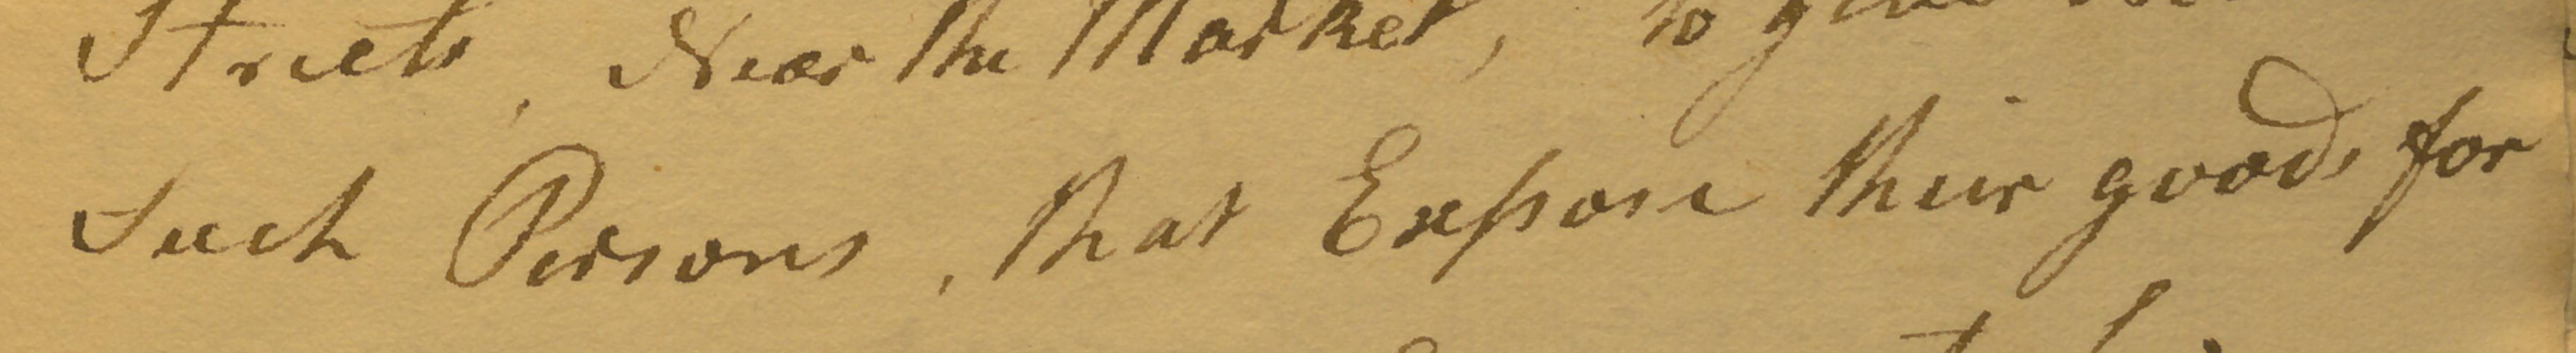such Persons that Expose their goods for
